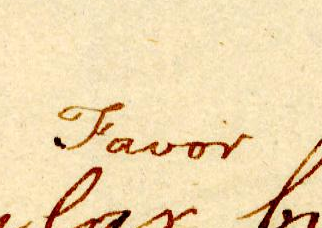Favor
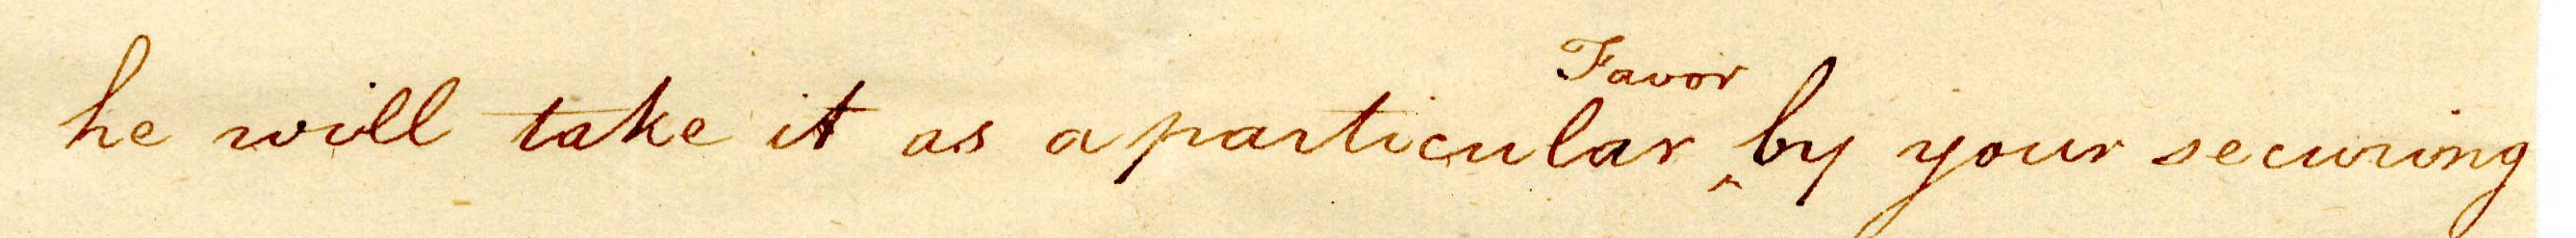he will take it as a particular ^ by your securing
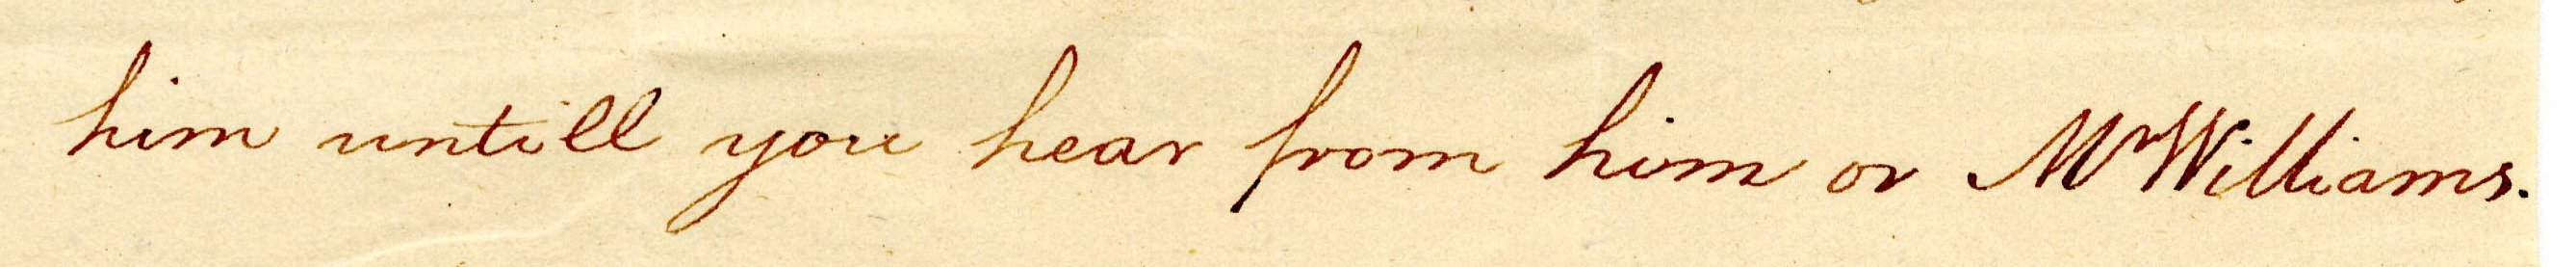him untill you hear from him or M^cWilliams.
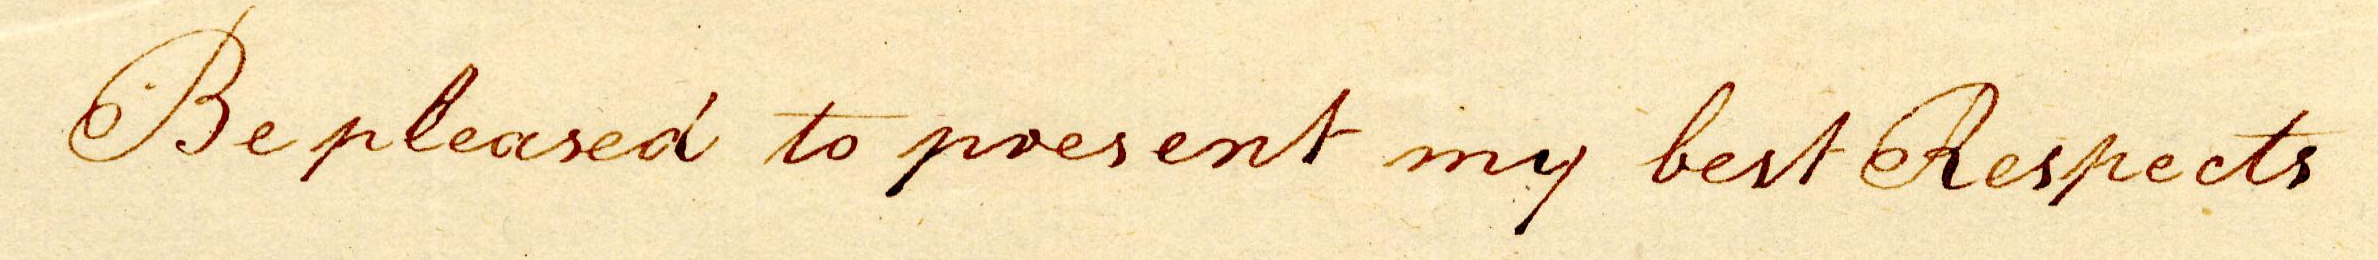Be pleasant to present my best Respects
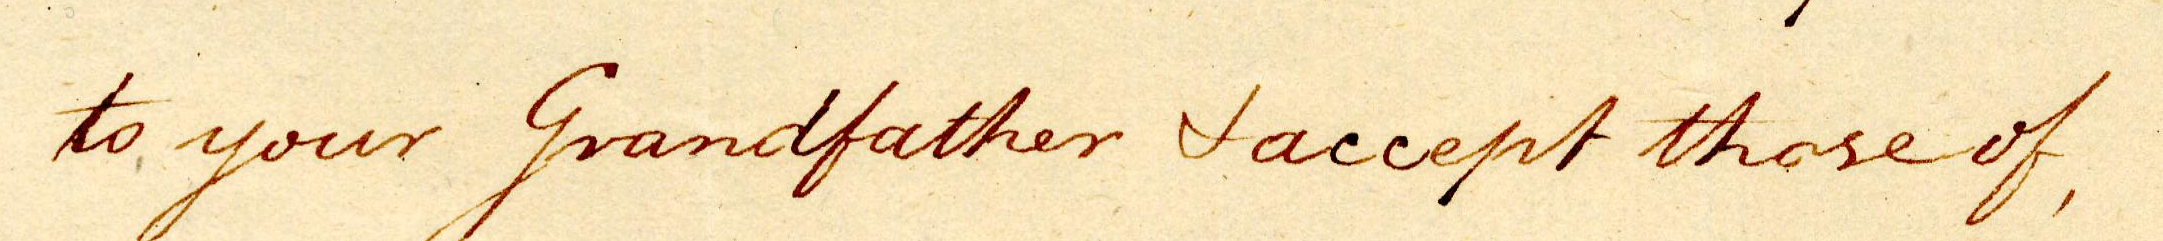to your Grandfather & accept those of,
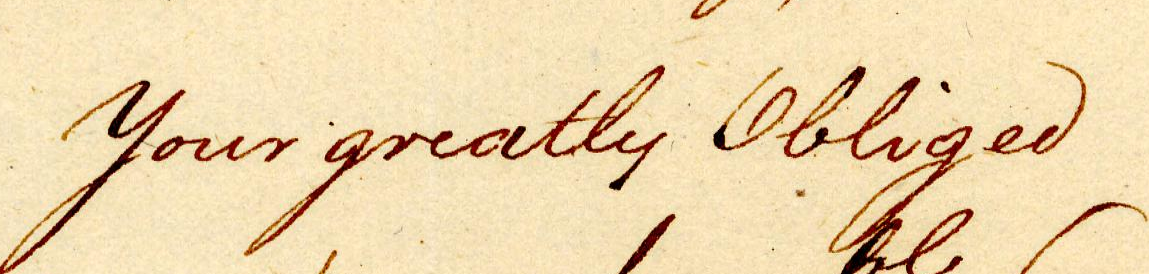Your greatly Obliged
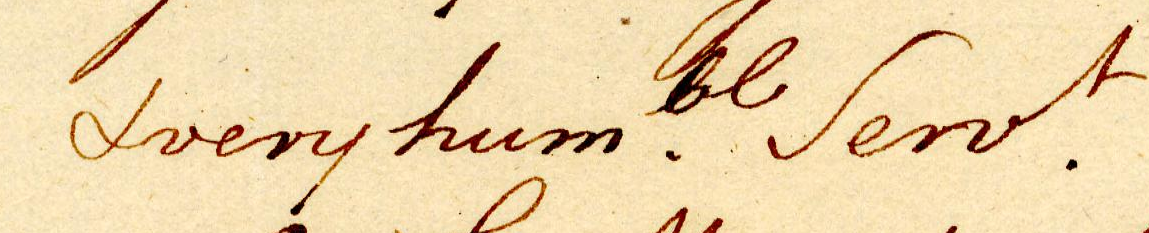& very hum^bl. Serv^t.
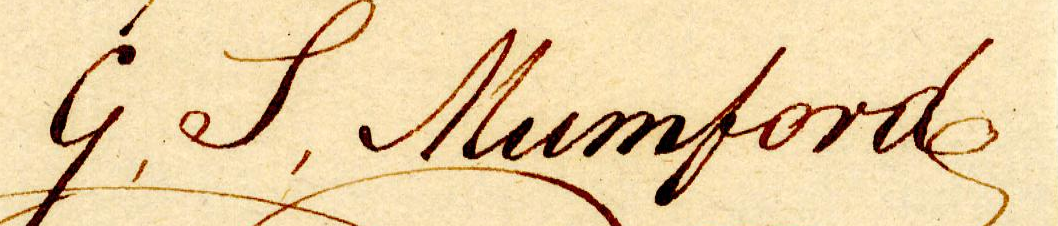G. S. Mumford
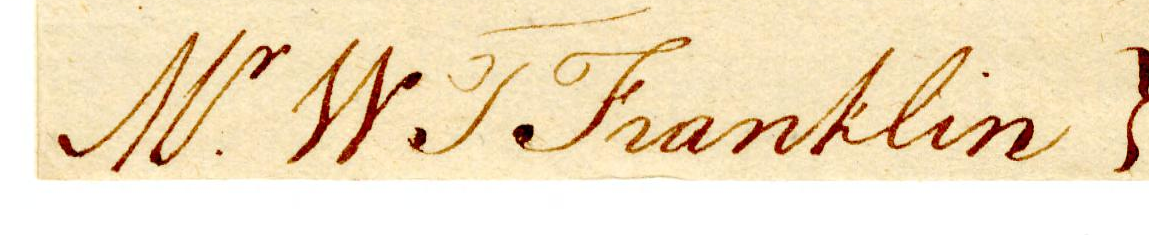M^r. W T Franklin
